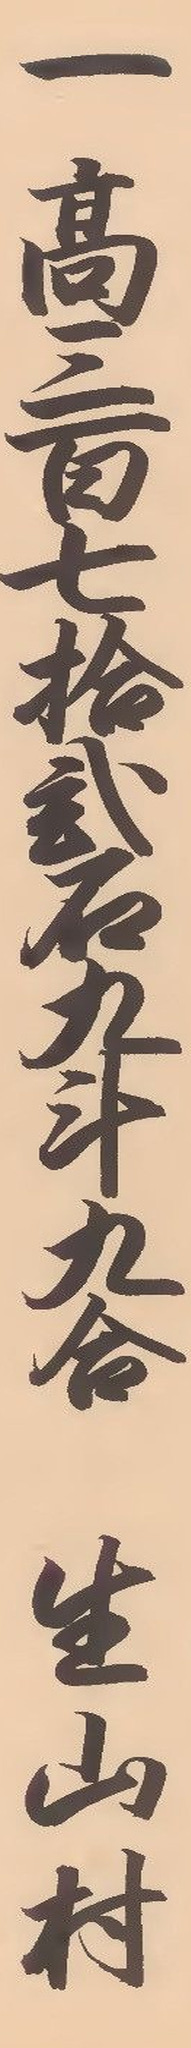一高三百七拾弐石九斗九合生山村
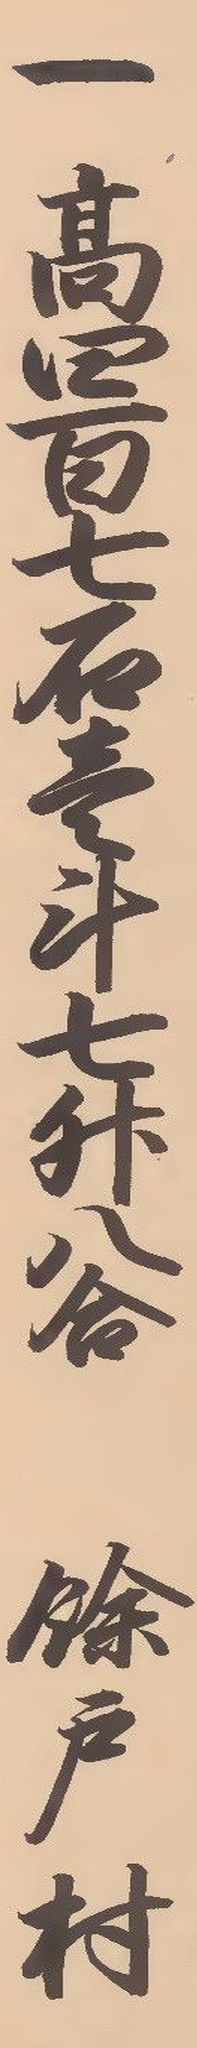一高四百七石壱斗七升八合余戸村
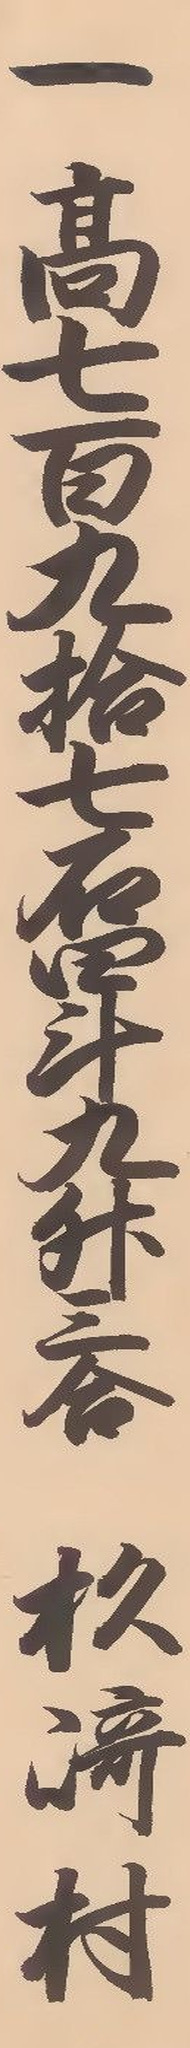一高七百九拾七石四斗九升三合杉崎村
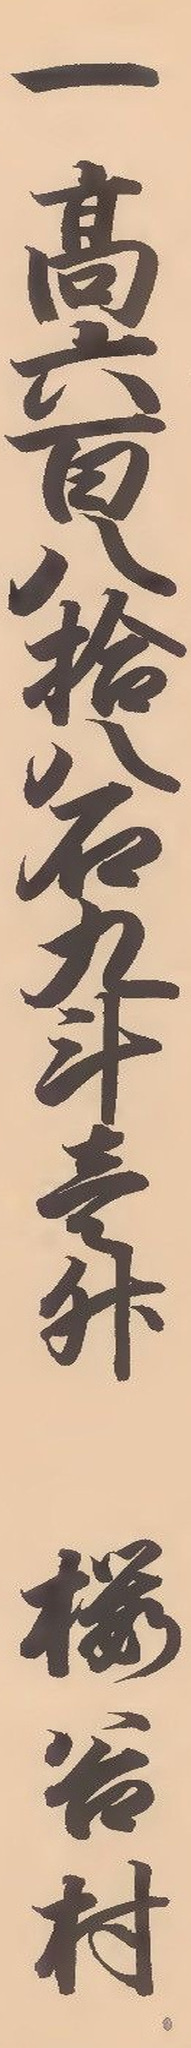一高六百八拾八石九斗壱升桜谷村
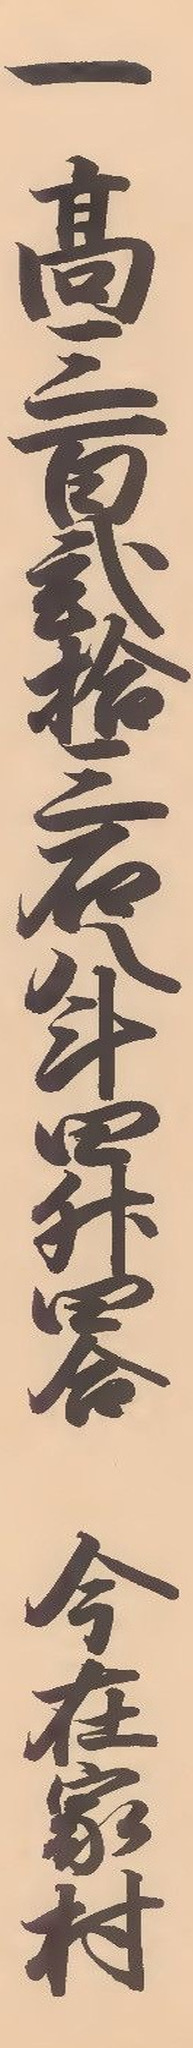一高三百弐拾三石八斗四升四合今在家村

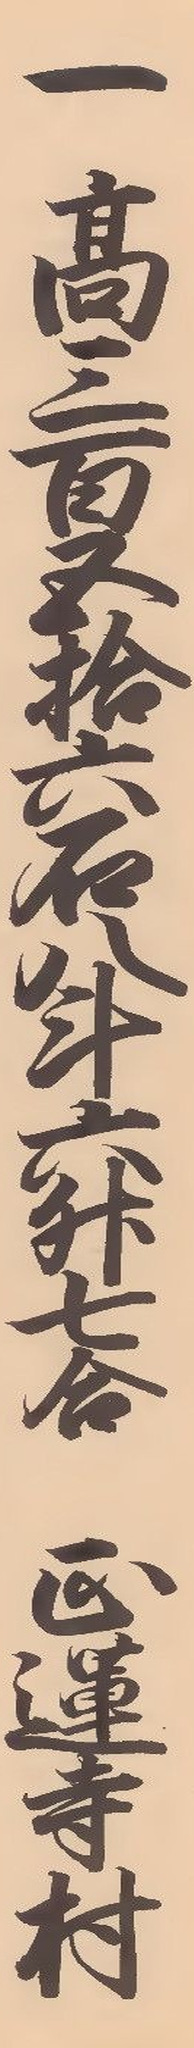一高三百五拾六石八斗六升七合正蓮寺村
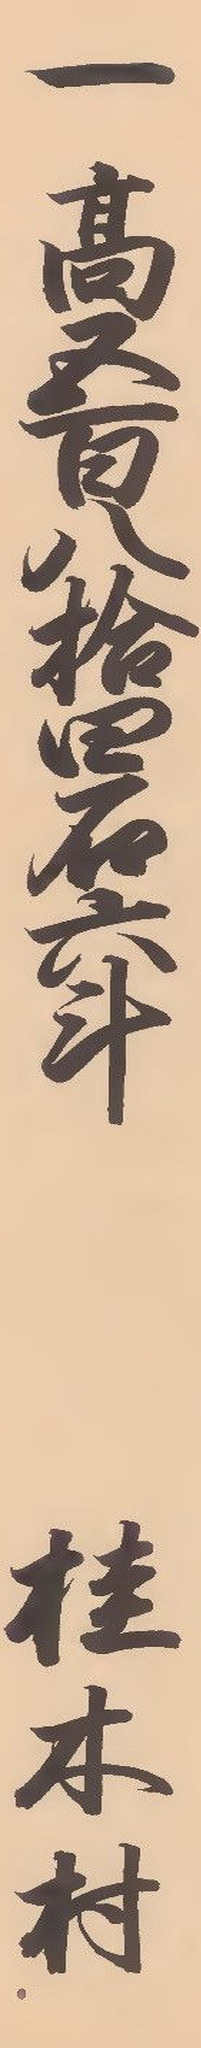一高五百八拾四石六斗桂木村
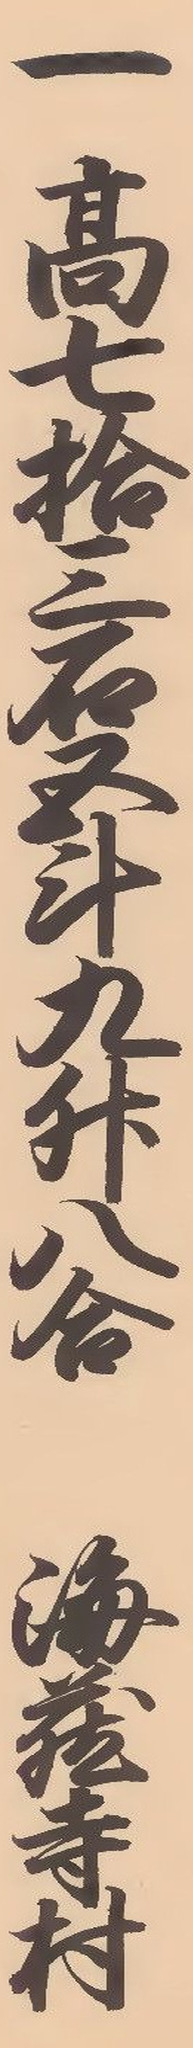一高七拾三石五斗九升八合海蔵寺村
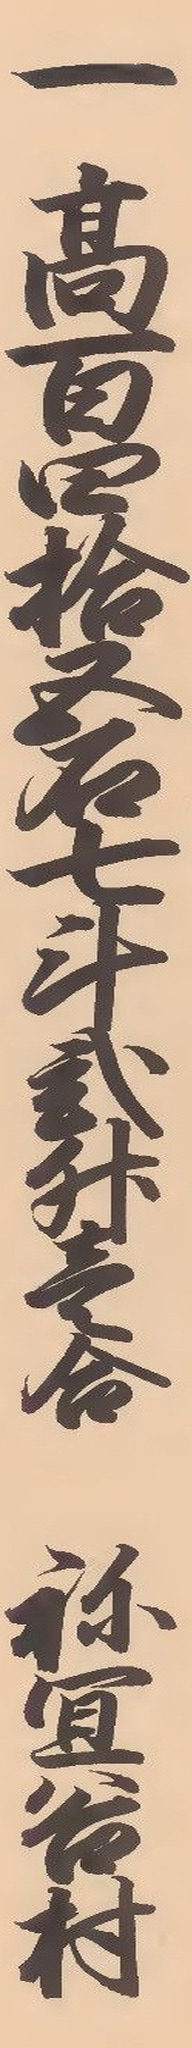一高百四拾五石七斗弐升壱合祢宜谷村
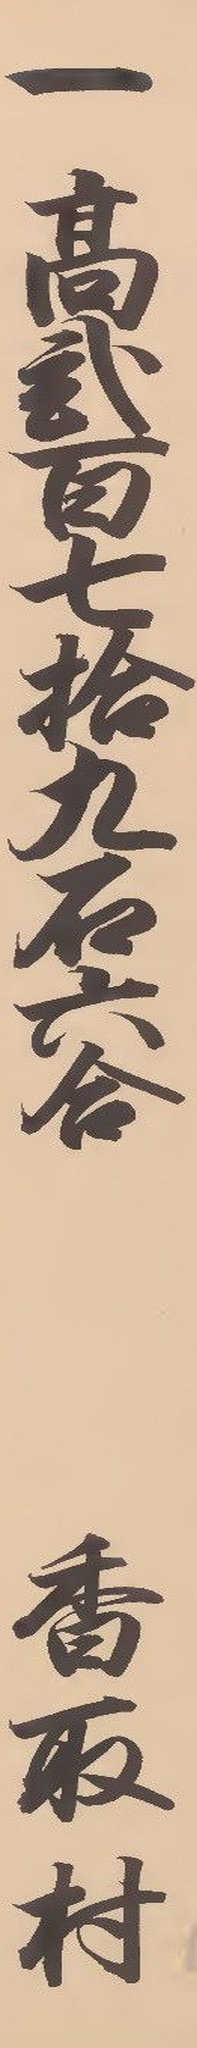一高弐百七拾九石六合香取村
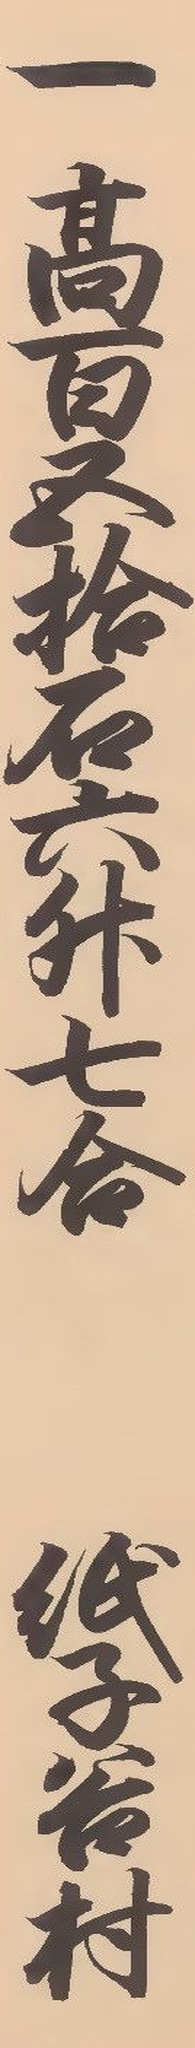一高百五拾石六升七合紙子谷村
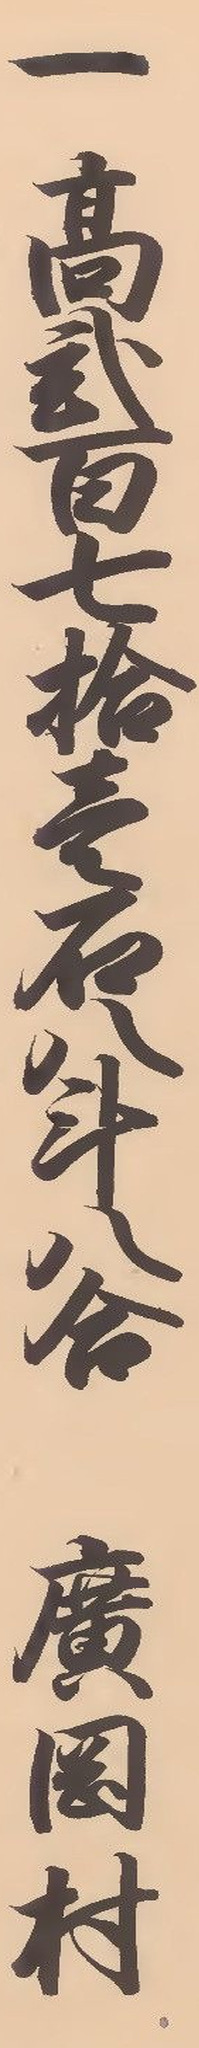一高弐百七拾壱石八斗八合広岡村
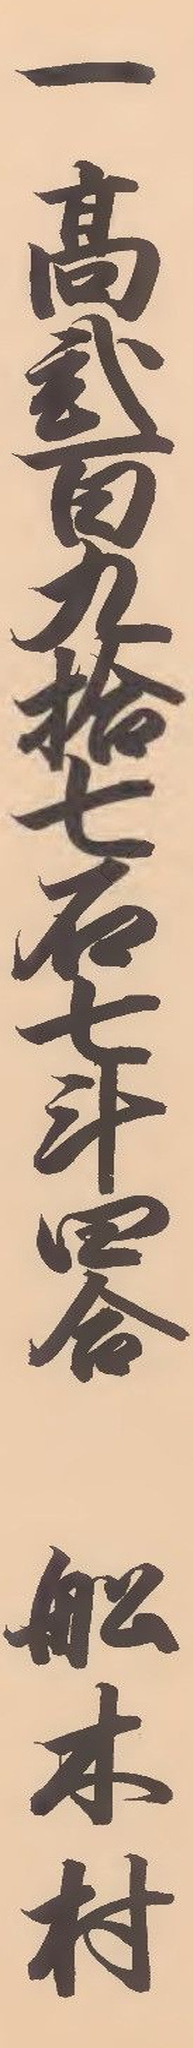一高弐百九拾七石七斗四合船木村

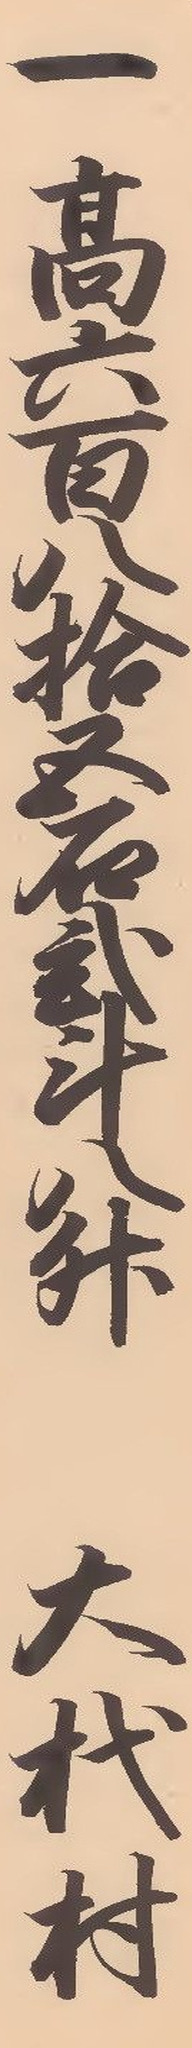一高六百八拾五石弐斗八升大找村
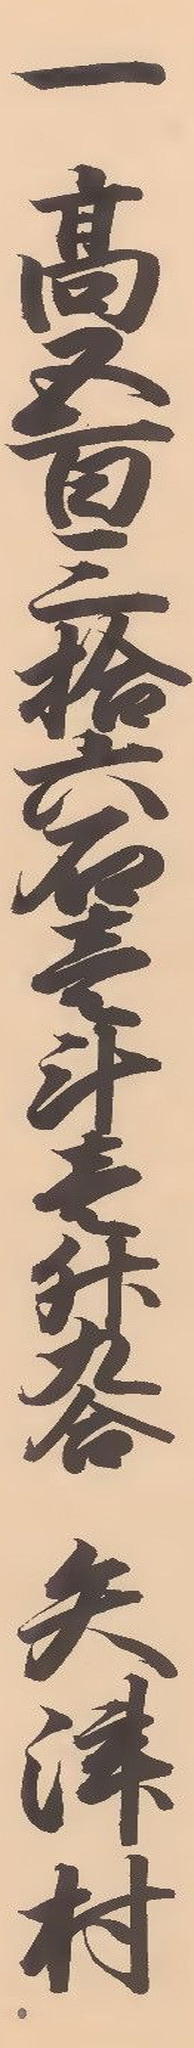一高五百三拾六石壱斗壱升九合矢津村
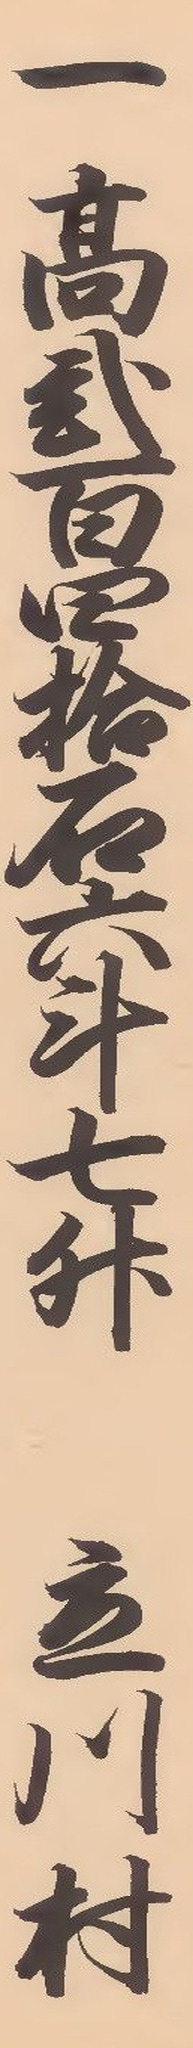一高弐百四拾石六斗七升立川村
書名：因幡国郷帳
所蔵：国立公文書館 National Archives of Japan
